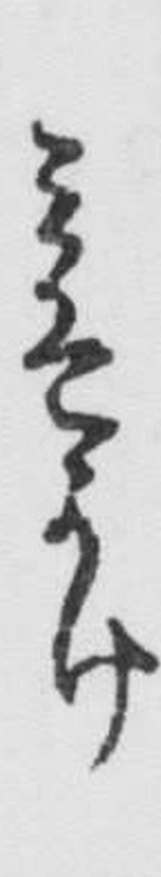みそかけ
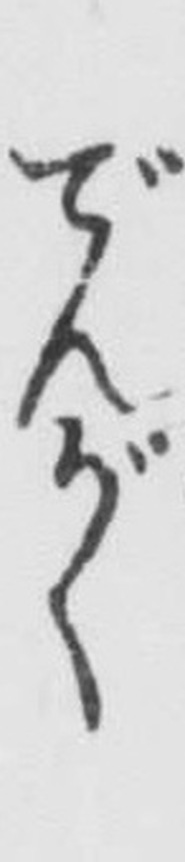でんがく
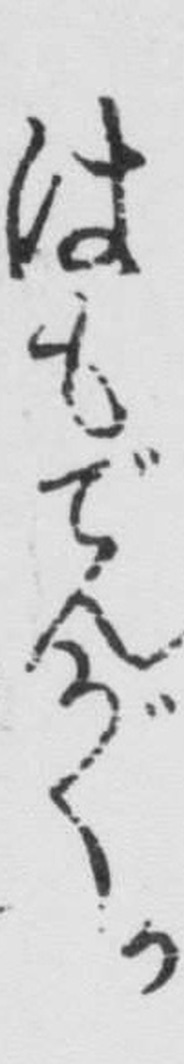はもでんがくか
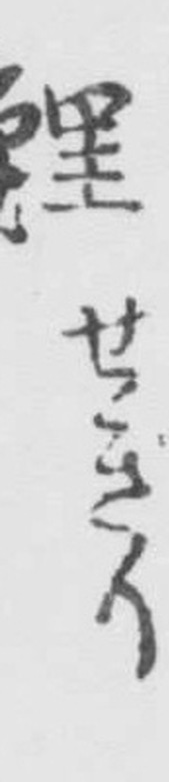鯉せぎり
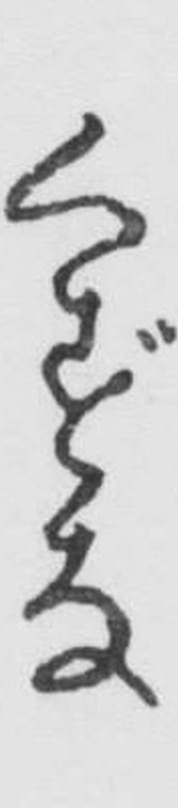くずな
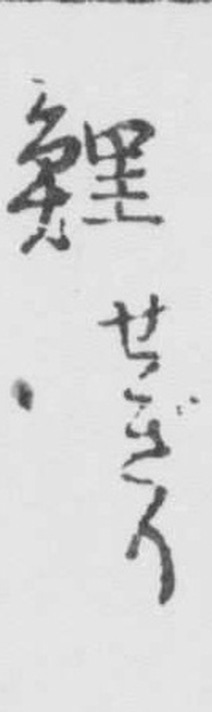鯉せぎり
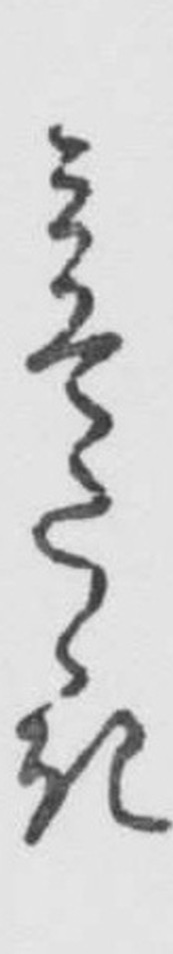みそたゝき
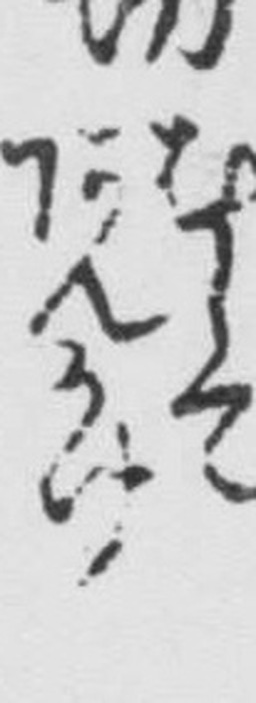あんかけ
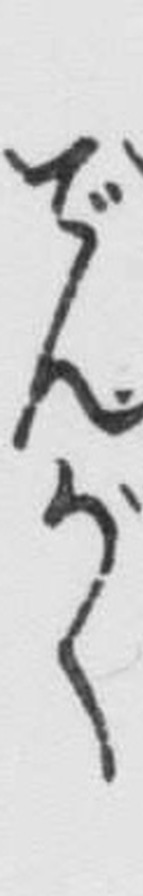でんがく
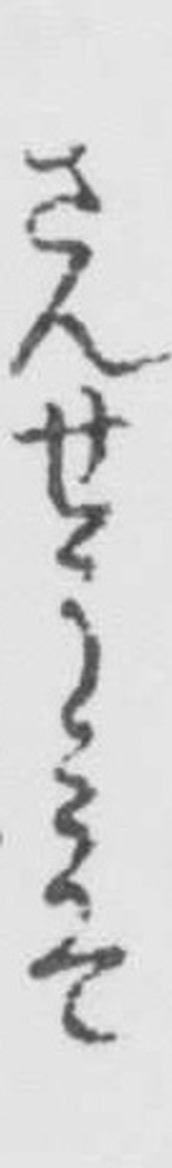さんせうみそ
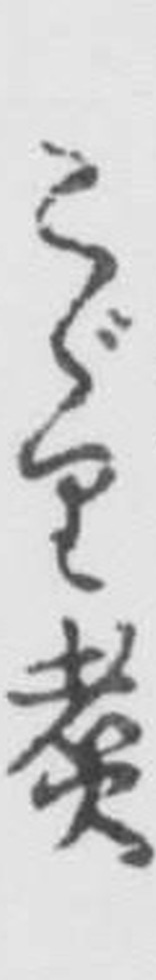こゞり煮
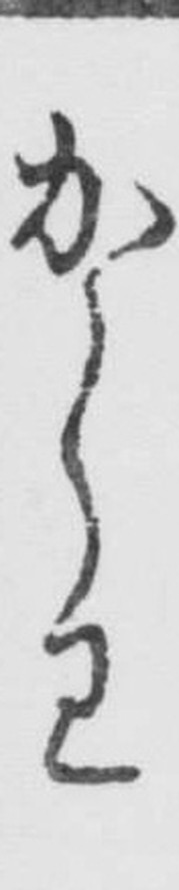かしわ
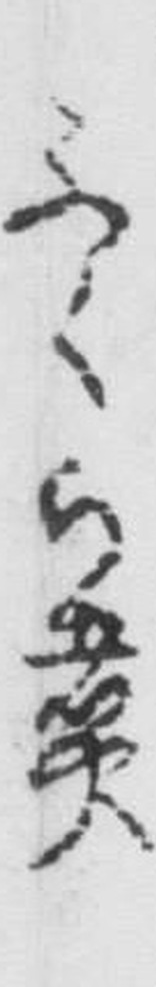ふくら煮
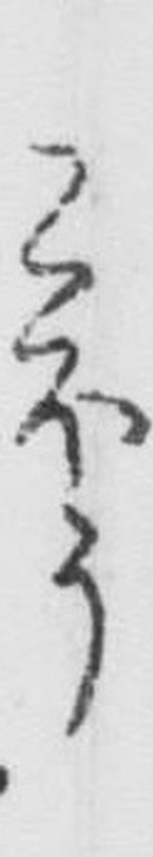こほう
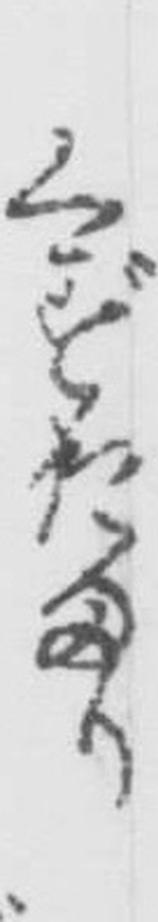くずたまり
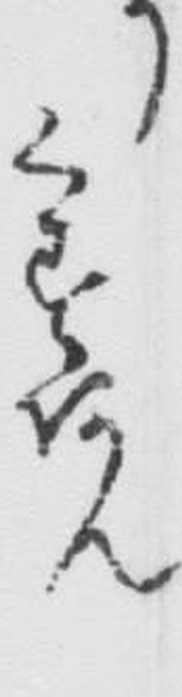くすあん
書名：諸家通用/即席料理
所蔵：大阪府立大学学術情報センター 国文学研究資料館
